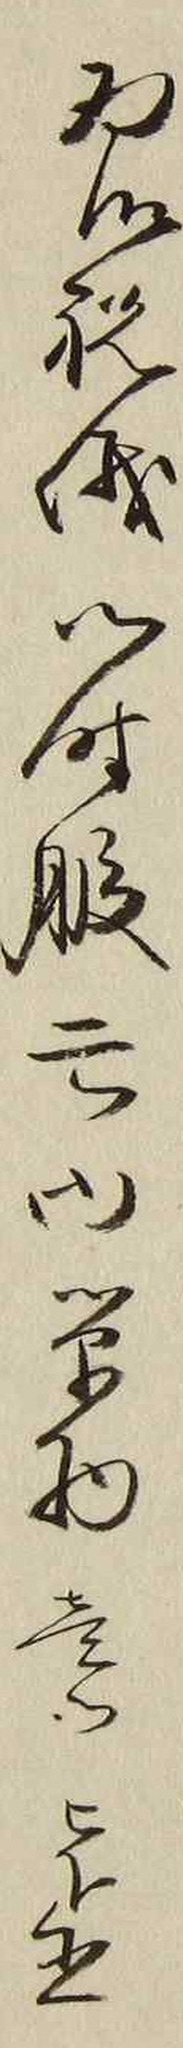為御祝儀御時服二つ内単物壱つ被下置
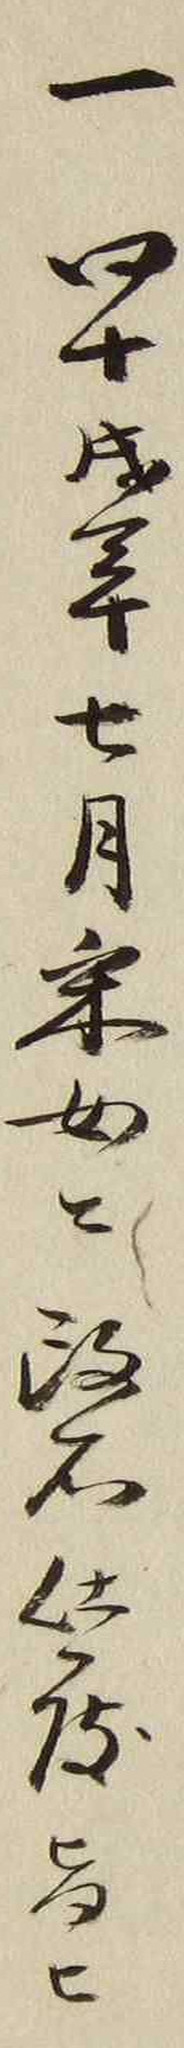一同十戌年七月采女と改名仕度旨被
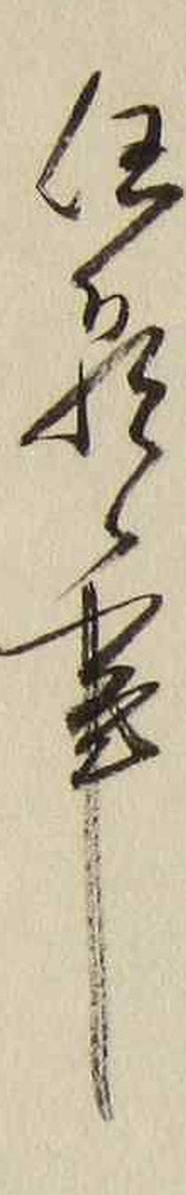被下置候事

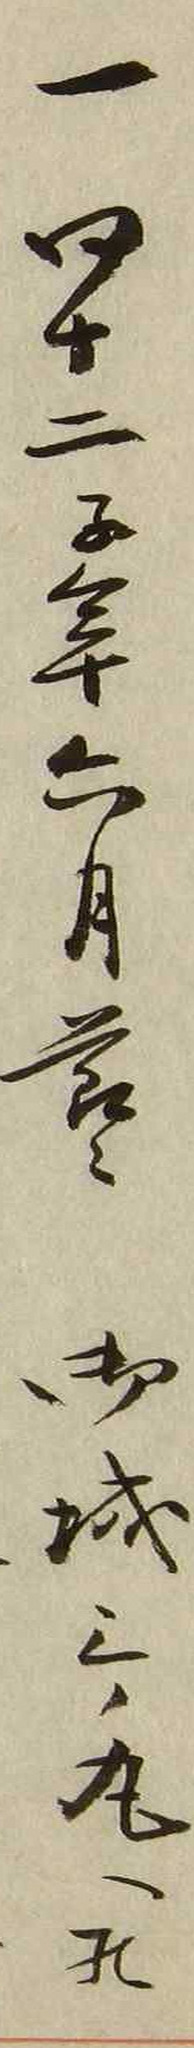一同十二子年六月節々御城三ノ丸へ罷
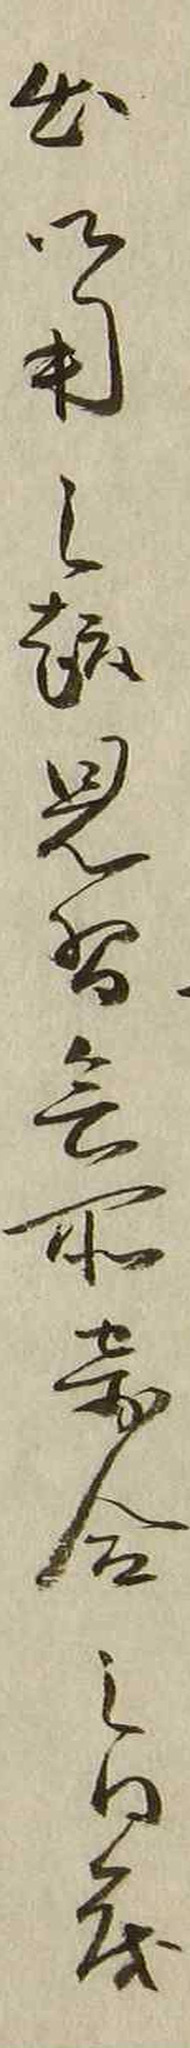出御用之趣見習会所寄合之内にも
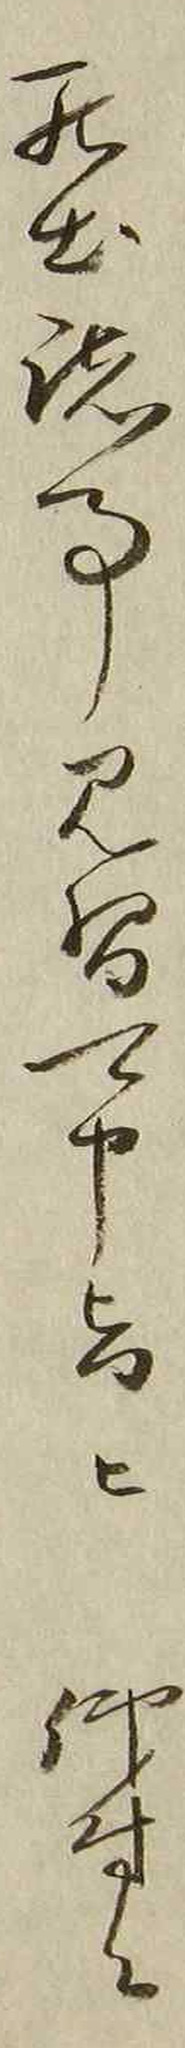罷出諸事見習可申旨被仰付候
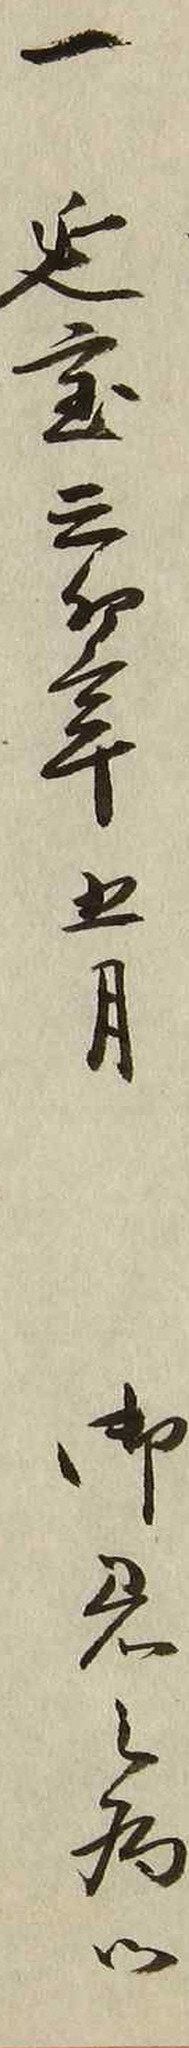一延宝三卯年五月御着之為御
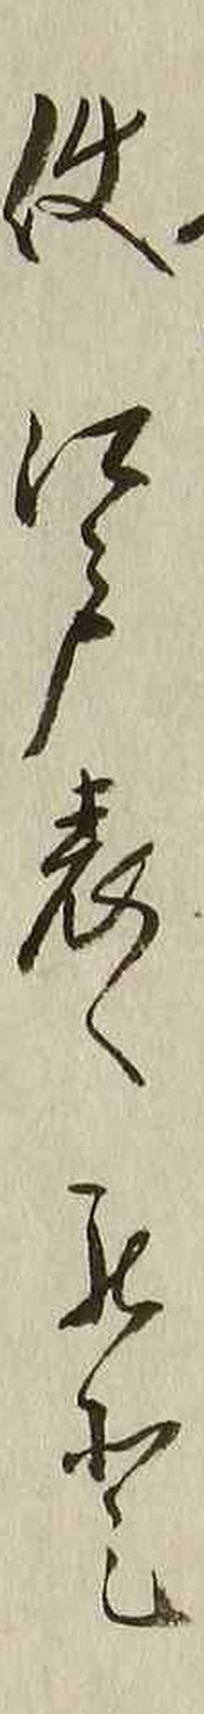使江戸表へ罷登
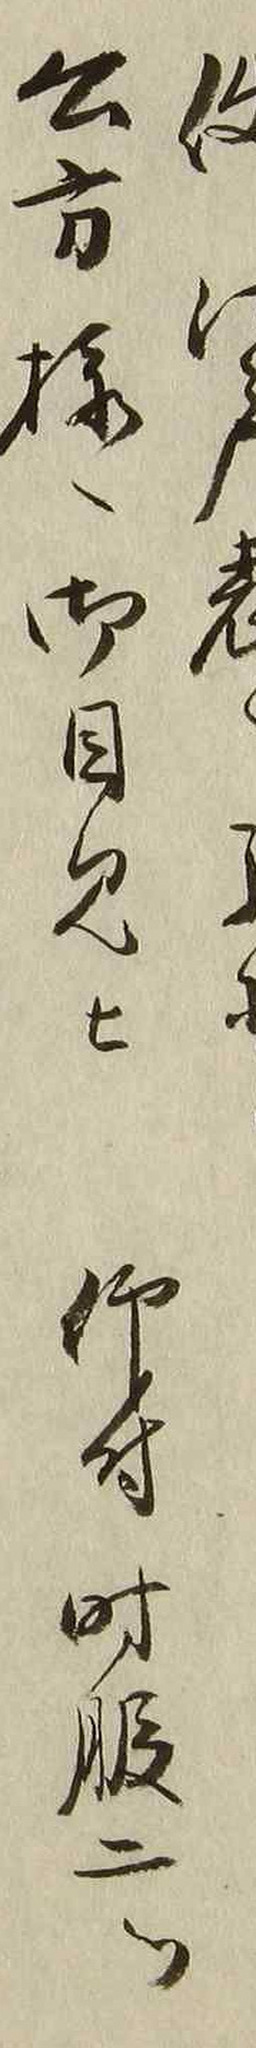公方様へ御目見被仰付時服二つ
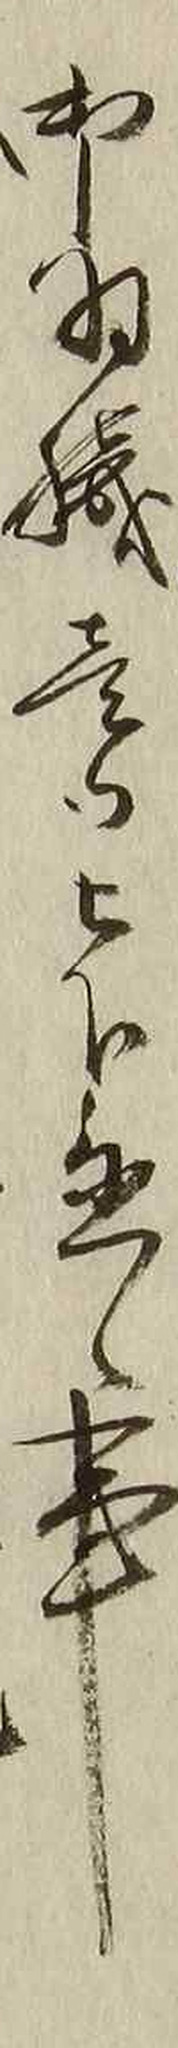御羽織壱つ被下置候事
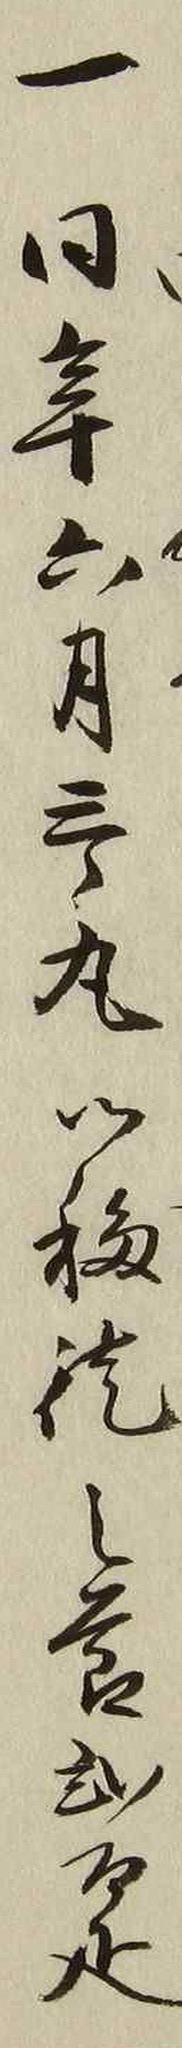一同年六月三ノ丸御移徙之節弐百疋
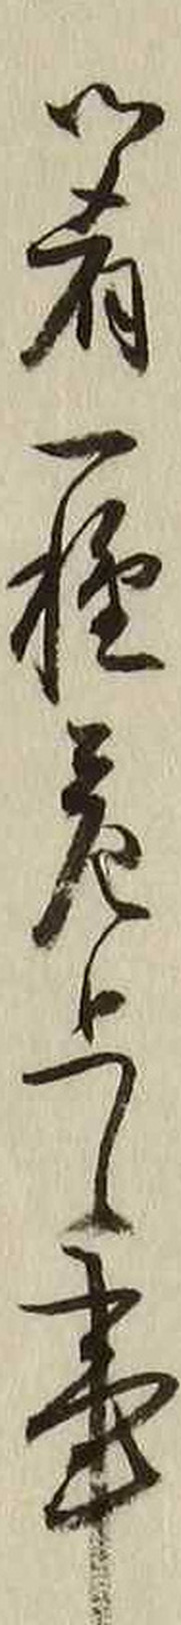御肴一種差上候事
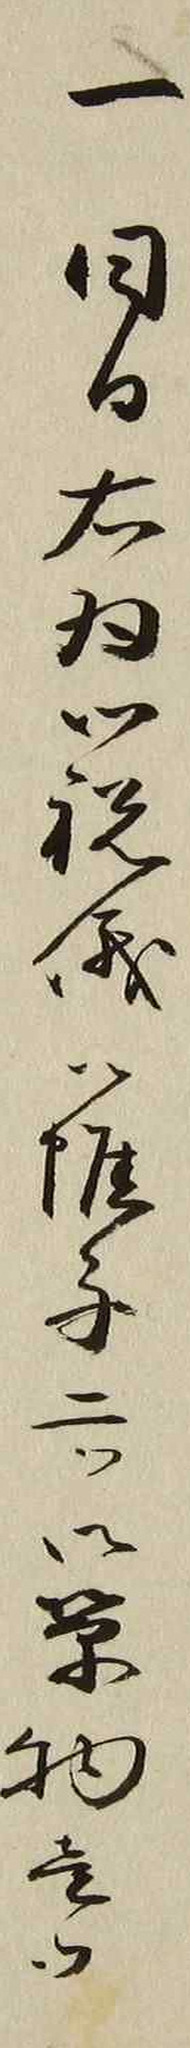一同日右為御祝儀御帷子二つ御単物壱つ
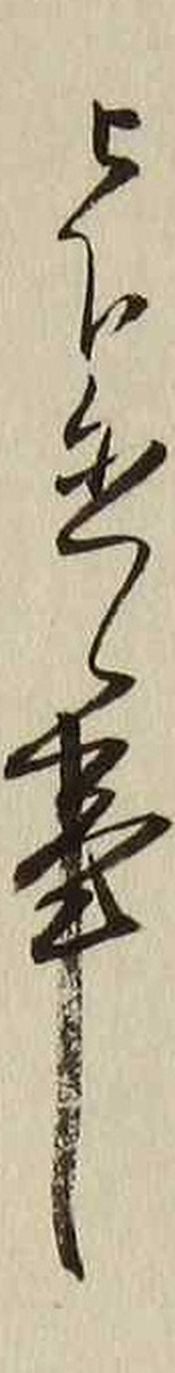被下置候事
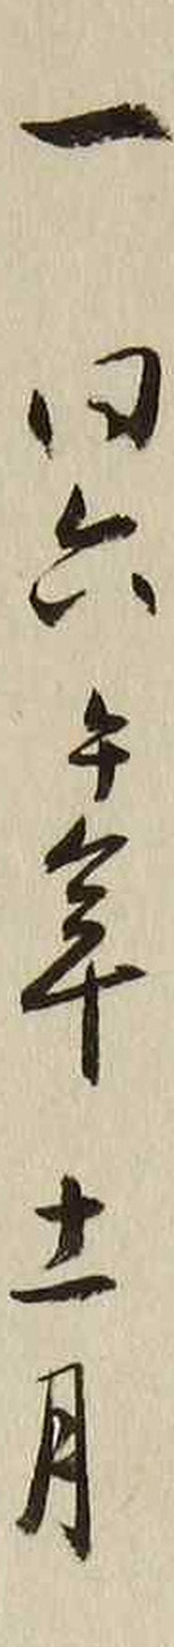一同六午年十一月
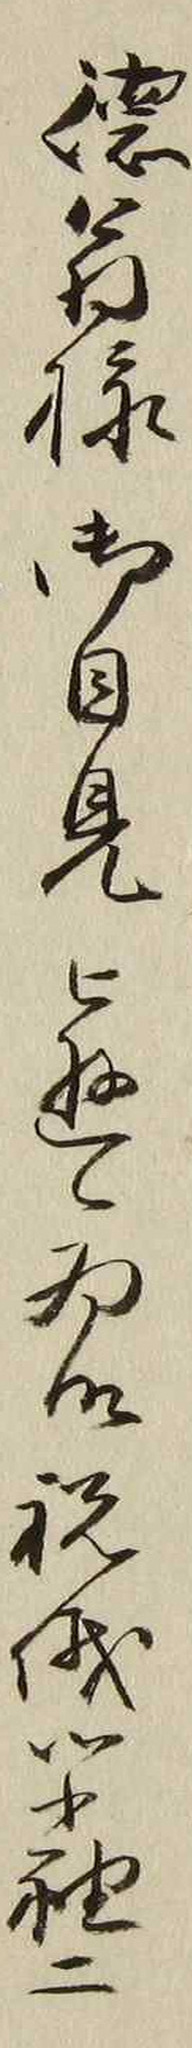徳翁様御目見被遊候為御祝儀御子袖二
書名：諸士系譜　巻之292　き之部1
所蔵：会津若松市立会津図書館
